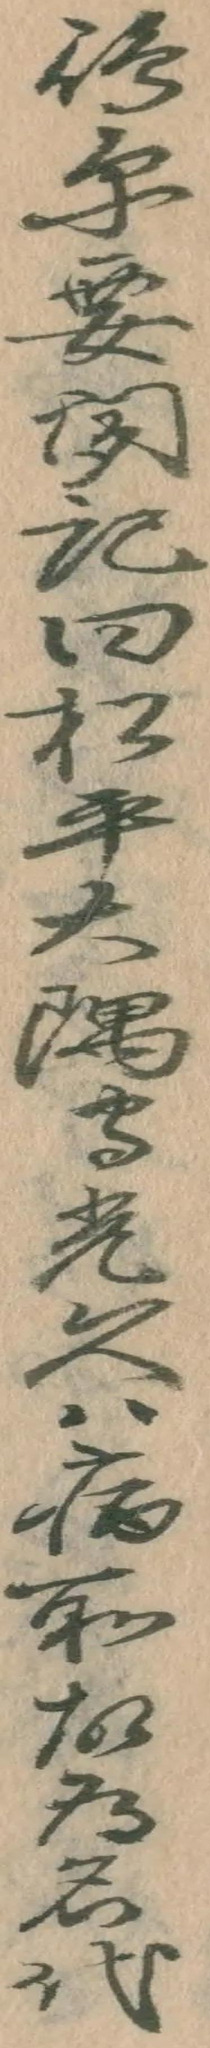島原要聞記曰松平大隅守光久は病所故為名代
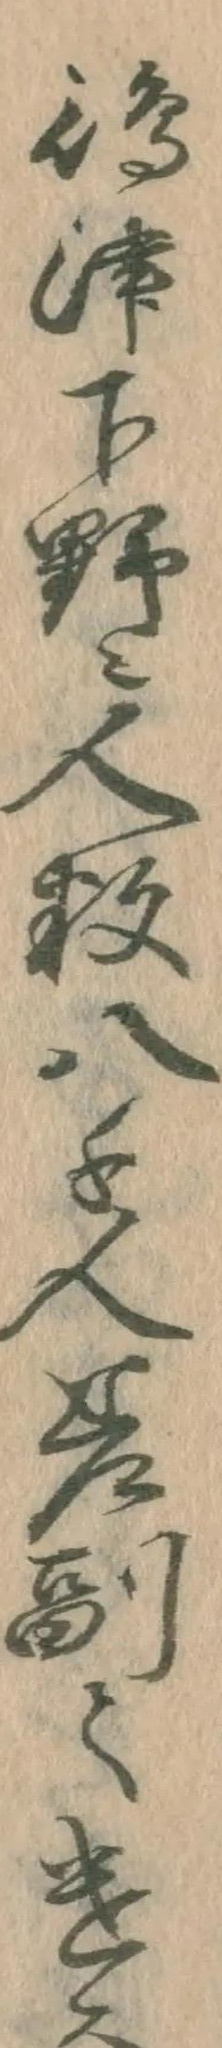島津下野に人数八千人差副て遣す
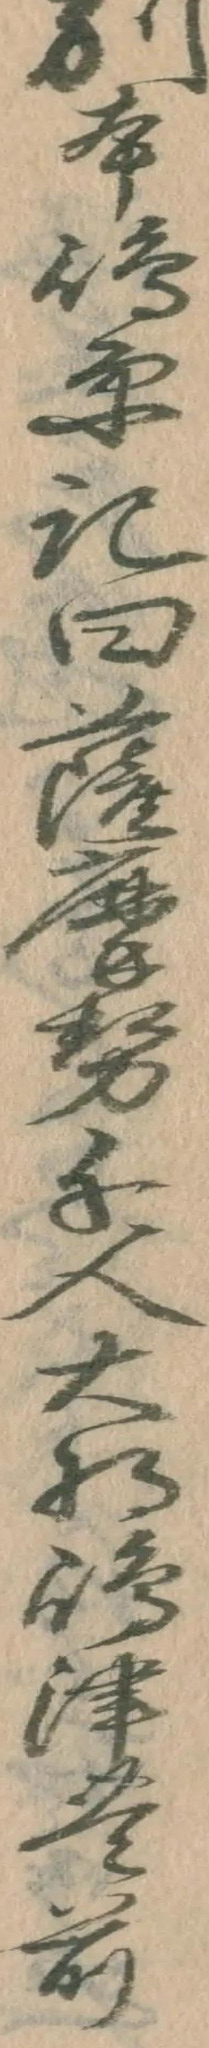別本島原記曰薩摩勢千人大将島津豊前
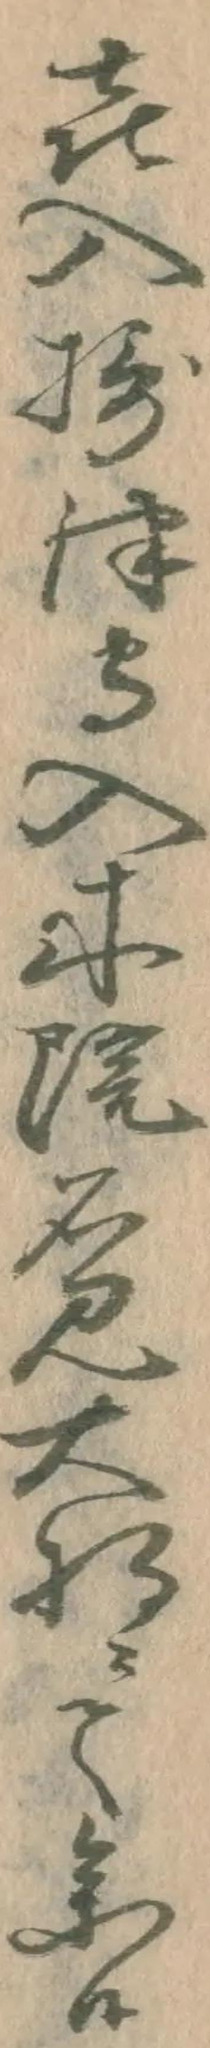喜入摂津守入来院石見大将にて参候
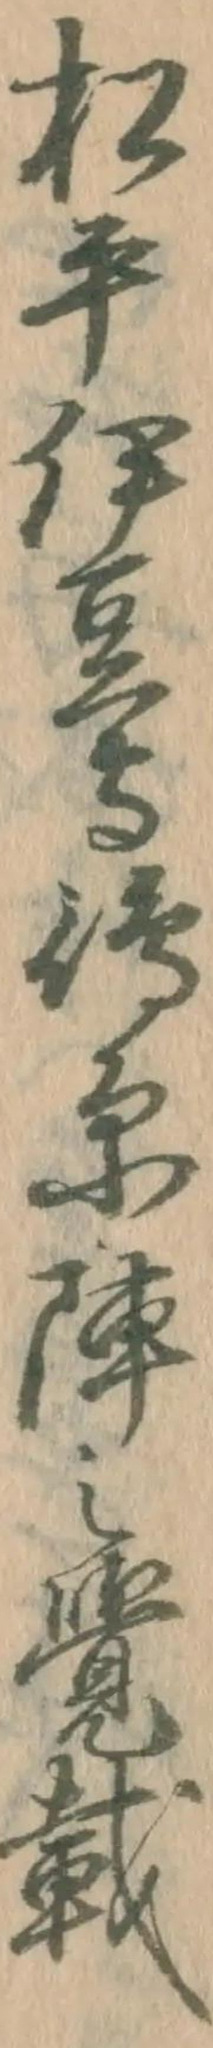松平伊豆守島原陣之覚載

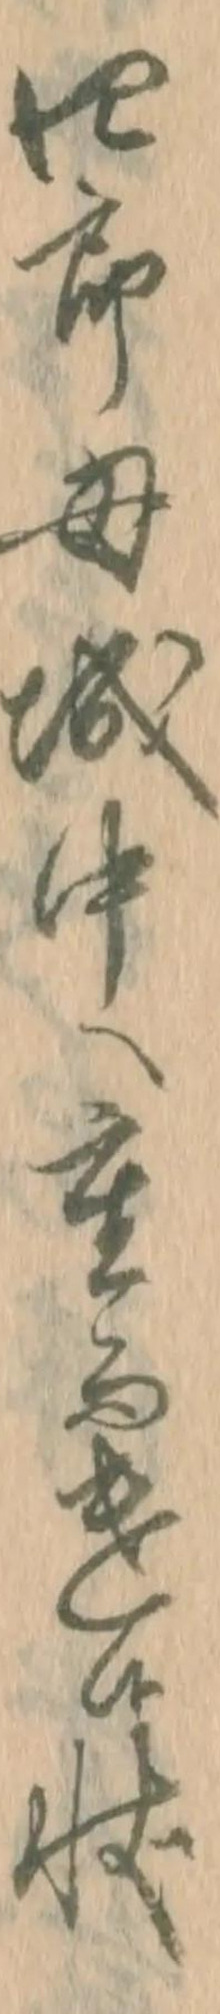四郎母城中へ重而遣候状
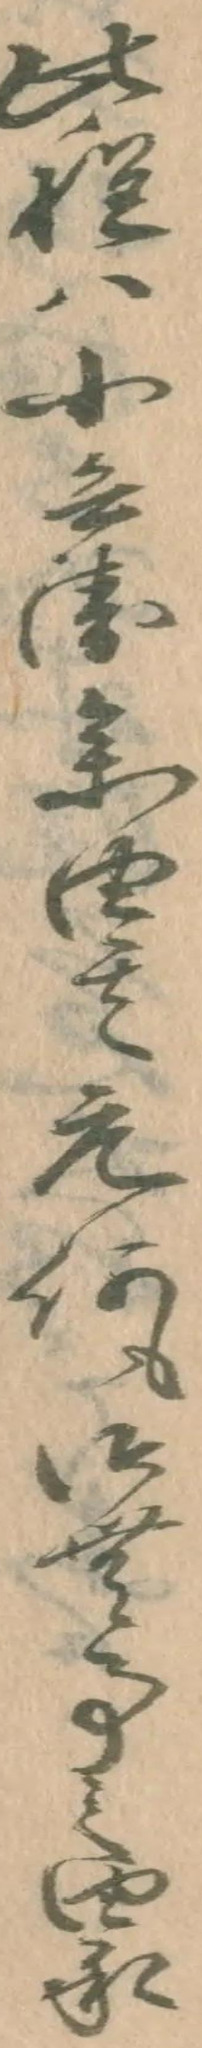此程は小兵衛参由其元何も御無事之由承
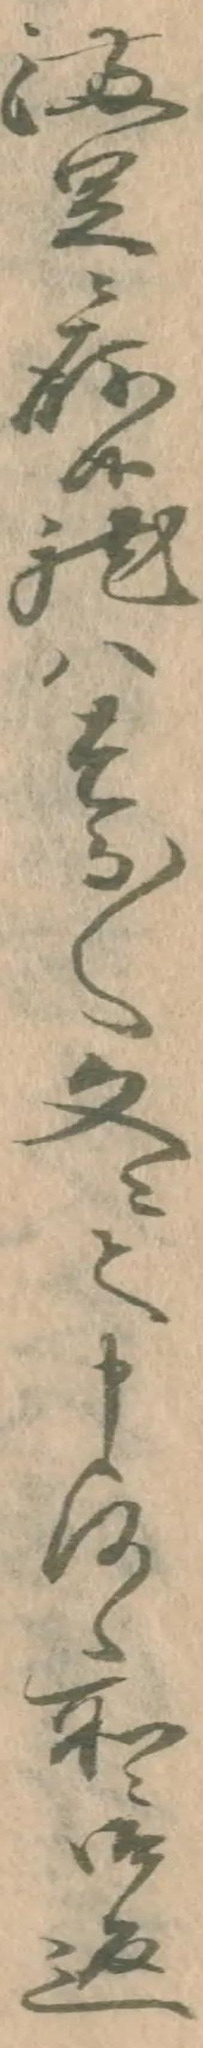満足に存候然ははる〳〵冬にて申参らせ候所に御返
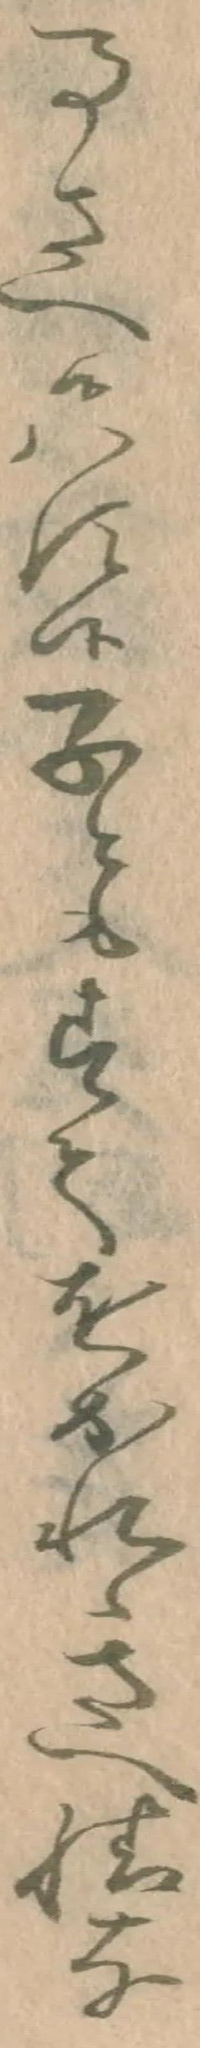事さへかは須候子とも春てをかれゝさへ情な
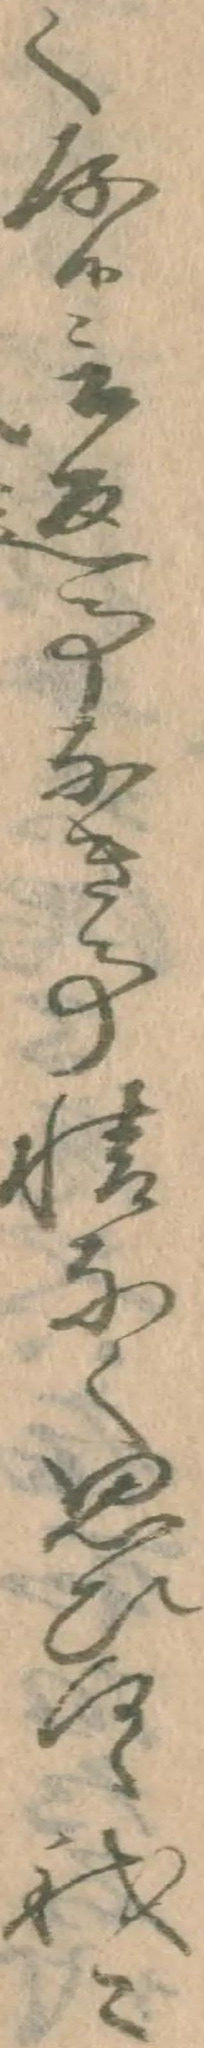く存候に御返事なき事情なく思ひ参らせ候我々
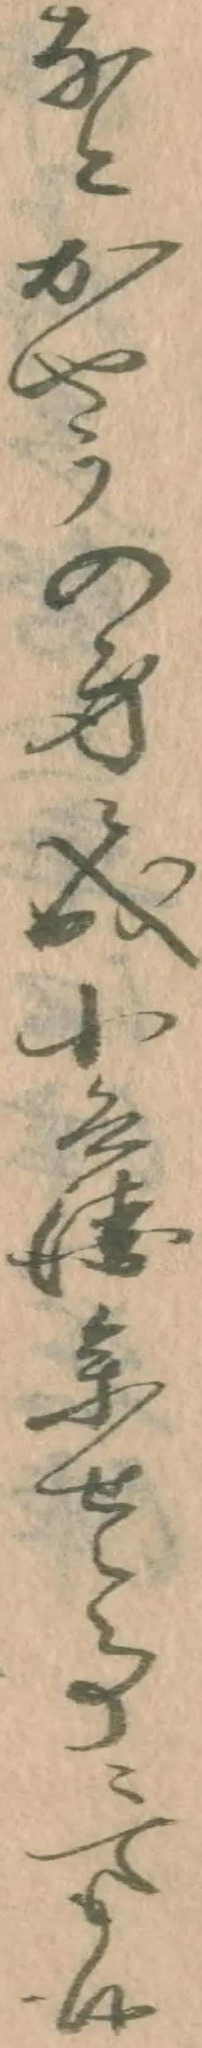なとかやうの身に成小兵衛参せ候事にても候
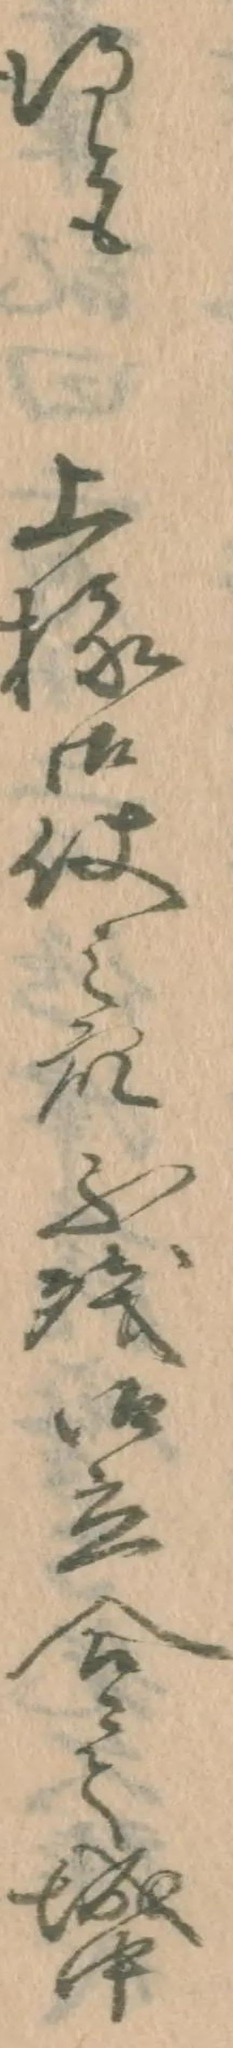得とも上様御使之衆ふ残御立合にて城中
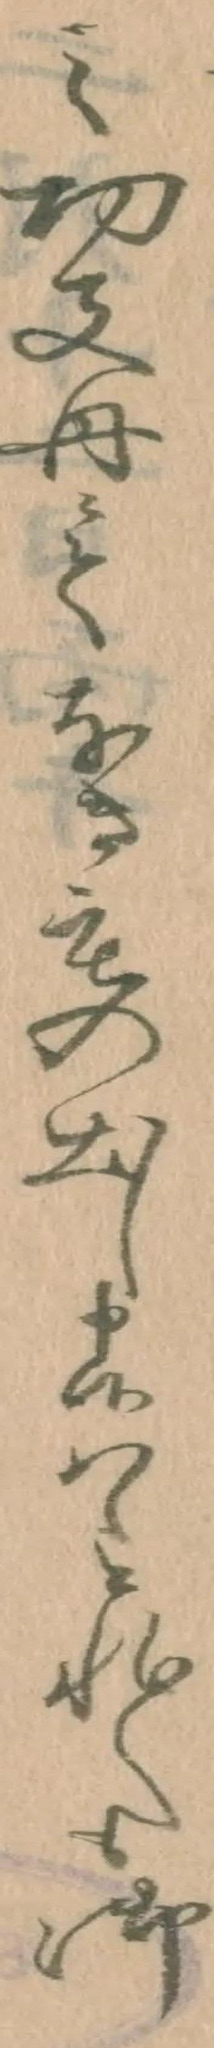之切支丹にてなきもの出し申候はゝとれ〱も御
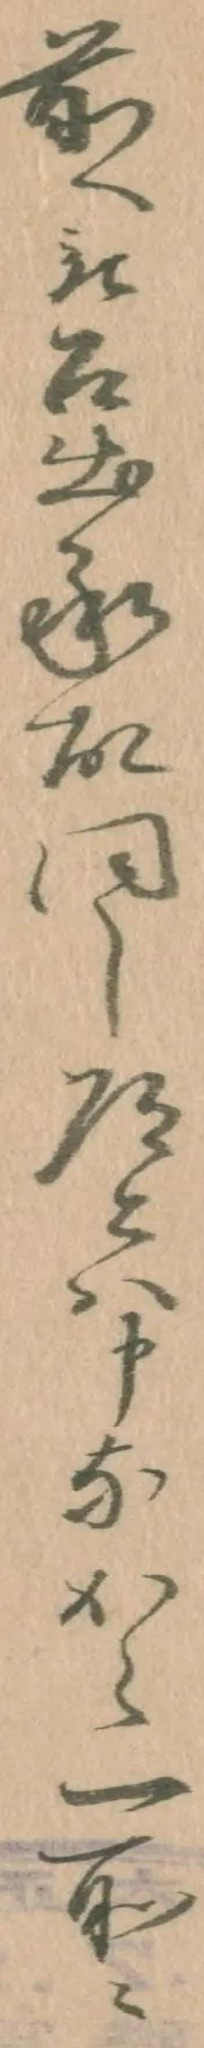前へ被召出承故同し道とは申なから一所に
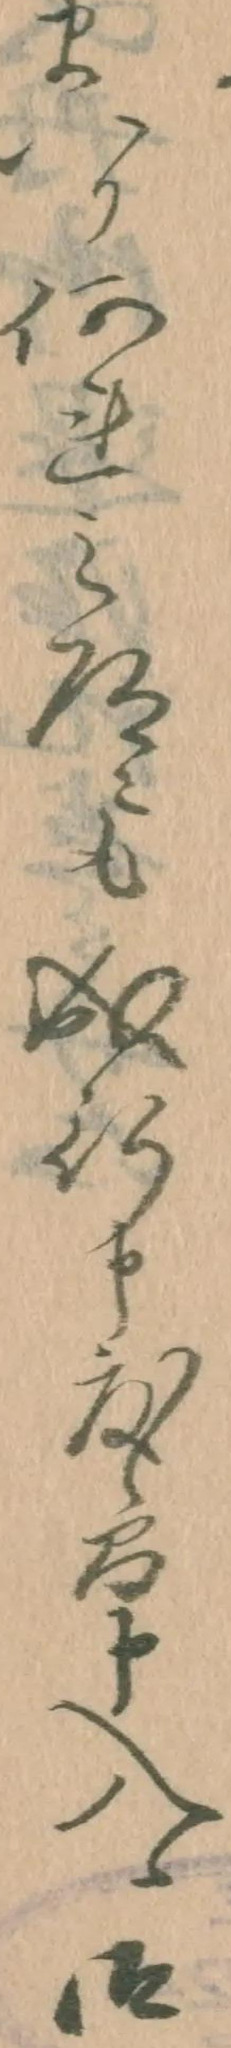まいり何連之道にも成行申度候間申入候御
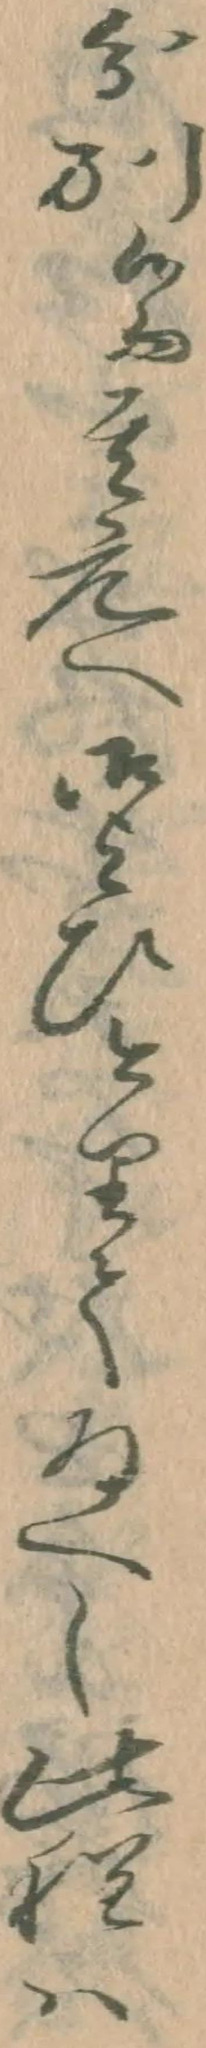分別候而其衆へ御与ひと里てゐへし此程は
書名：切支丹御退治記 49巻. [6]
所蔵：国立国会図書館 National Diet Library, JAPAN
